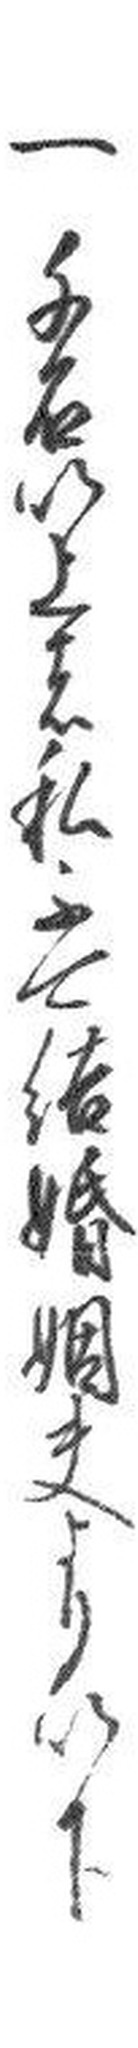一千石以上者私不可結婚夫より以下
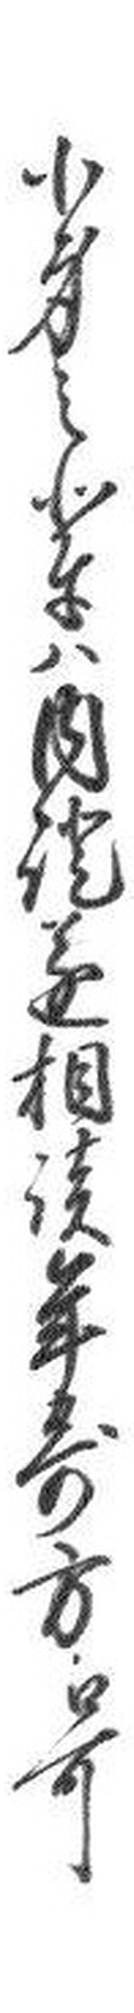小身之輩ハ内証遂相談年寄方江可
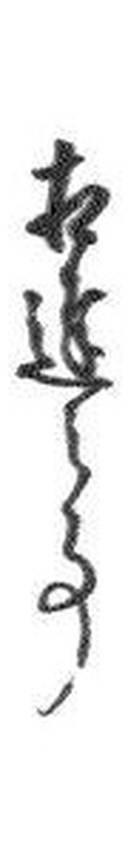相達之事
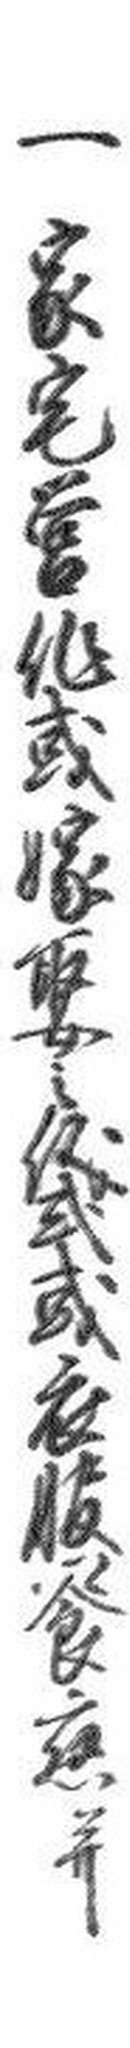一家宅営作或嫁娶之儀式或衣服饗応并
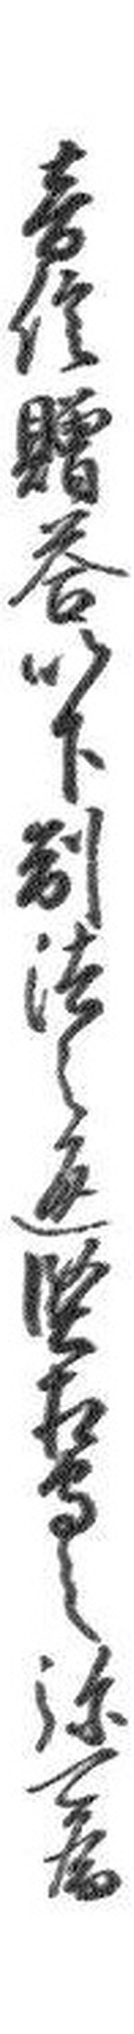音信贈答以下制法之通堅相守之弥可為
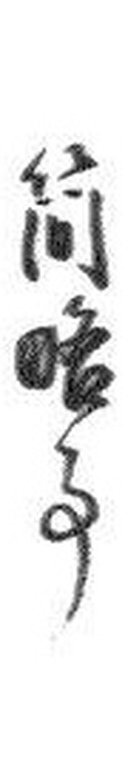簡略事
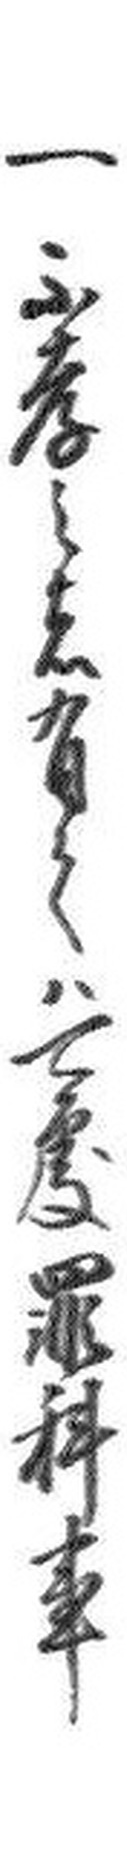不孝之者有之ハ可処罪科事
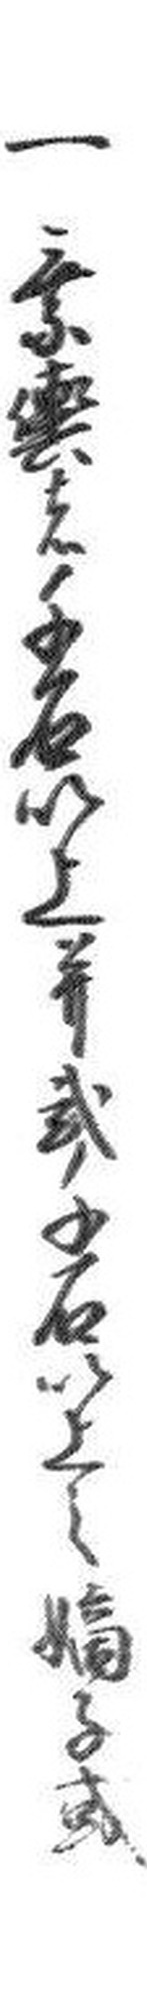一乗輿者千石以上并式千国以上之嫡子或
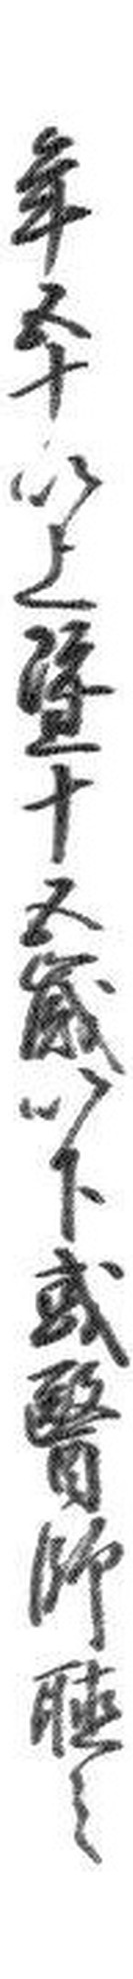年五十以上墜十五歳以下或医師聴之
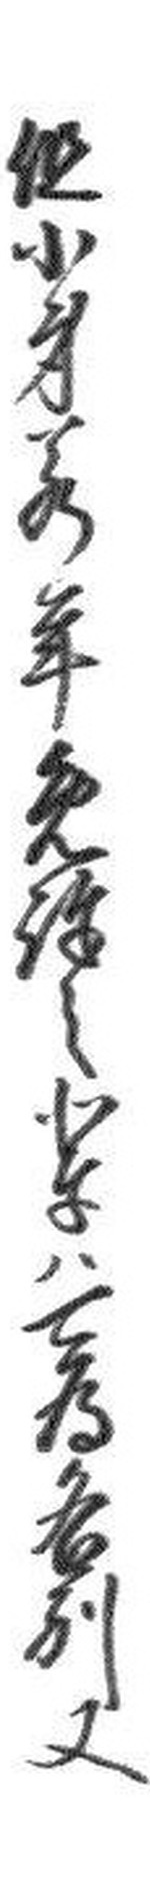組小身若年免許之輩ハ可為各別又
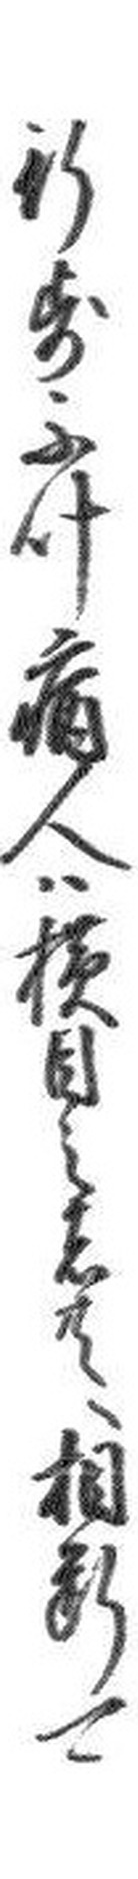行歩不叶病人ハ横目之者共ヘ相断可
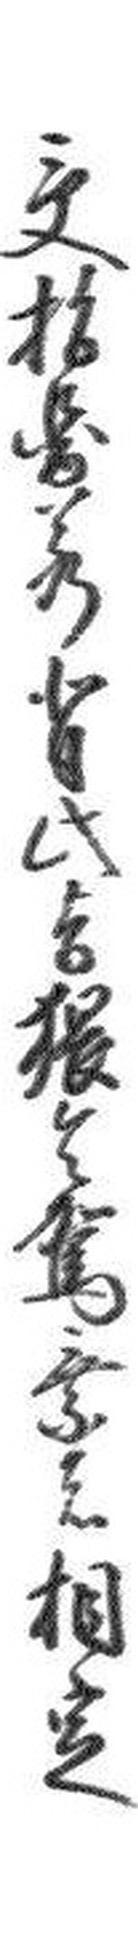受指図若背此旨猥令駕乗相定
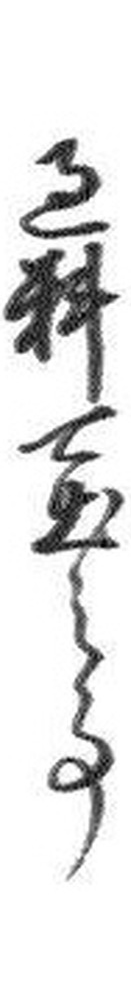過料可出之事

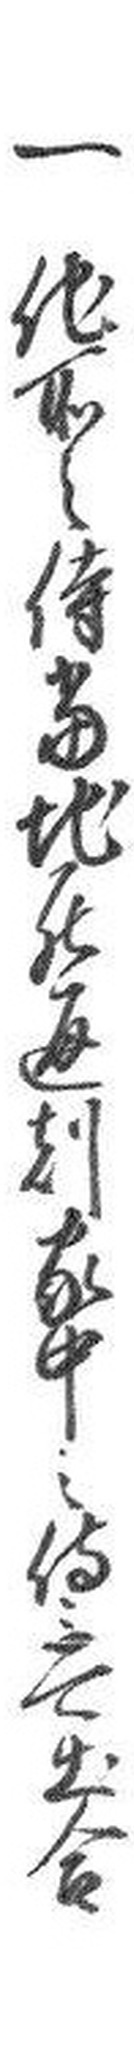一他所之侍当地罷通刻家中之侍不可出合
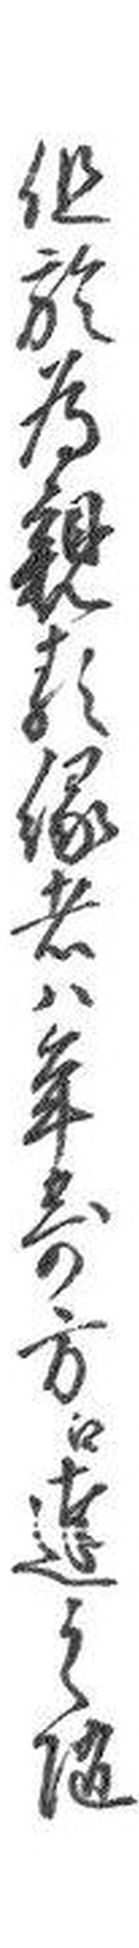但於為親類縁者ハ年寄方江達之随
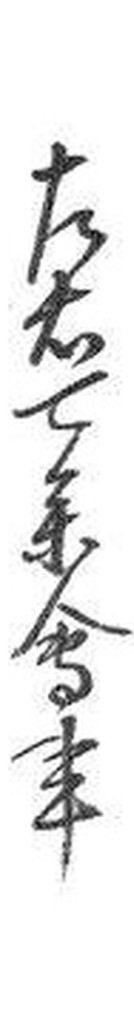左右可参会事
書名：家譜 十一 昌親公 従延宝二年到延宝四年八月
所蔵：福井県文書館 Fukui Prefectural Archives
